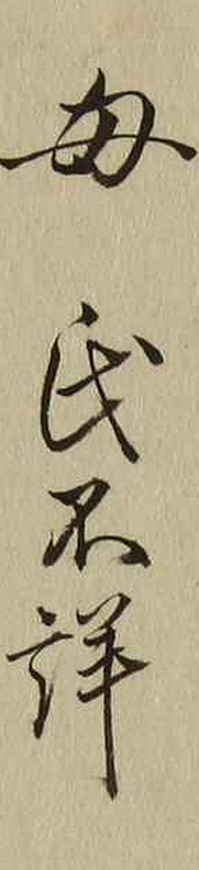母氏不詳
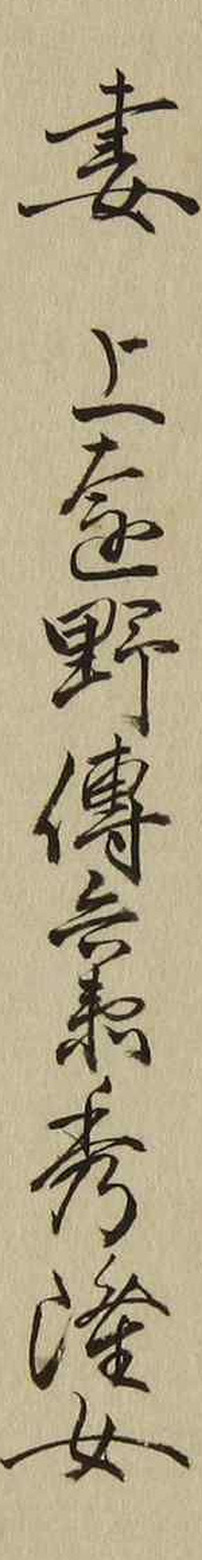妻上遠野伝兵衛秀隆女
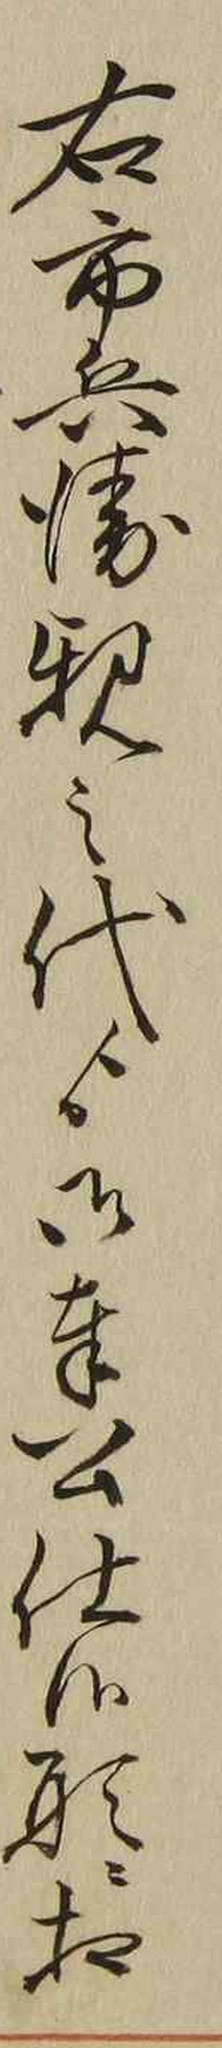右市兵衛親之代ゟ御奉公仕候形ニ相

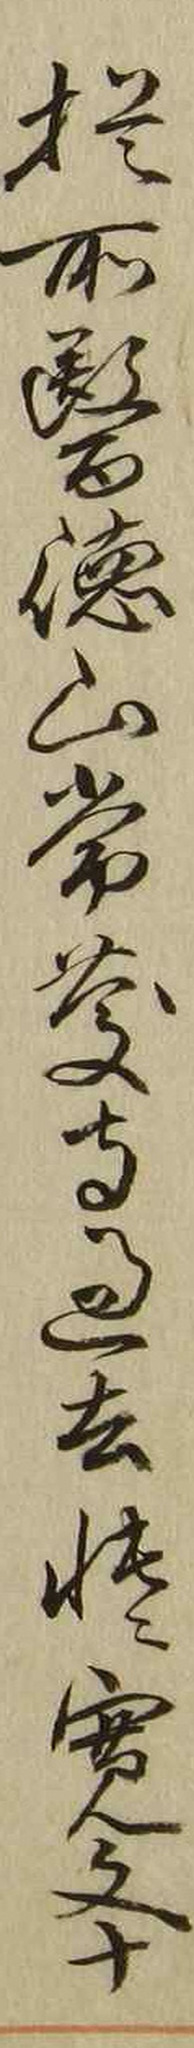提所医徳山常慶寺過去帳ニ寛文十
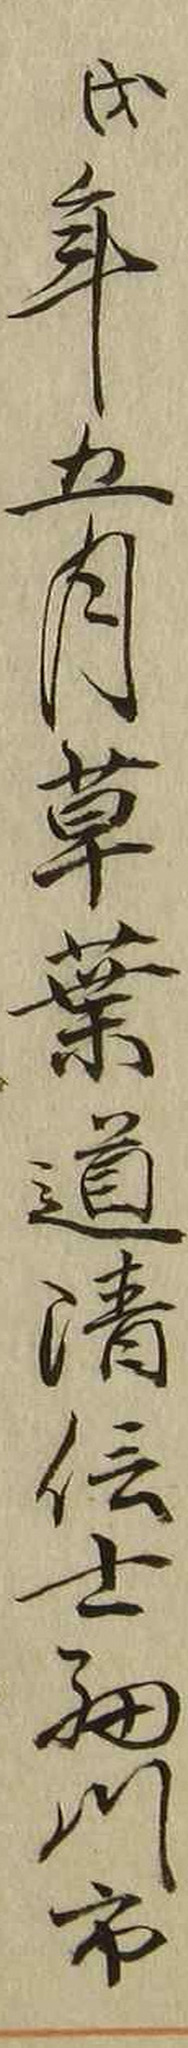戌年五月草葉道清信士細川市
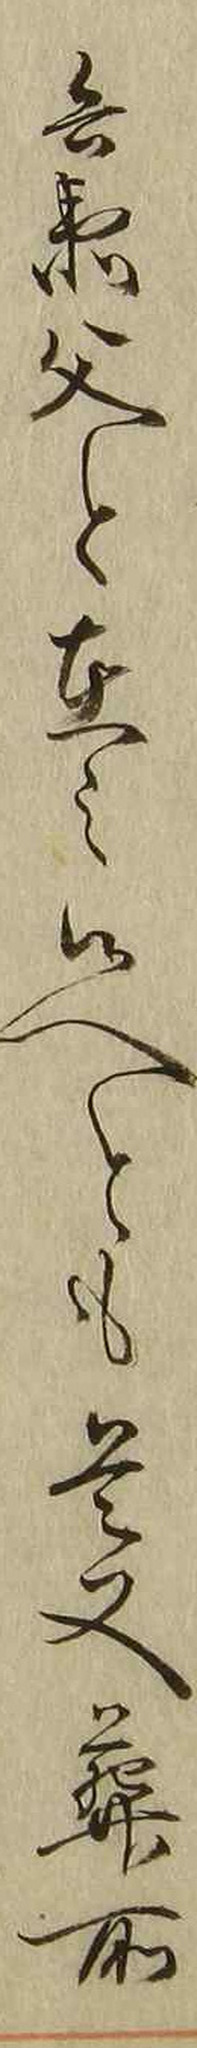兵衛父と在之候へとも是又葬所
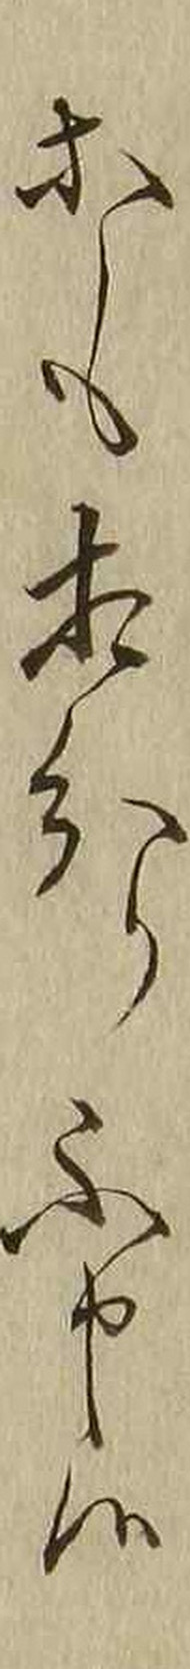等も相分り不申候
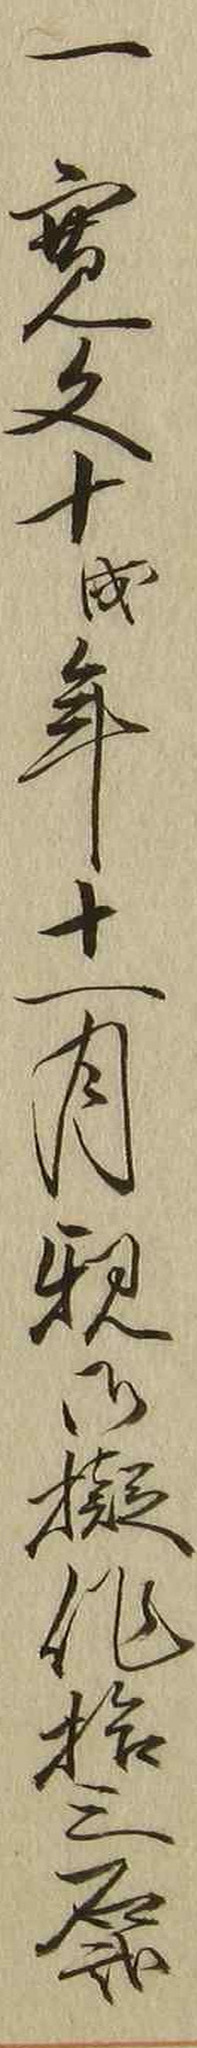一寛文十戌年十一月親御擬作拾三石弐
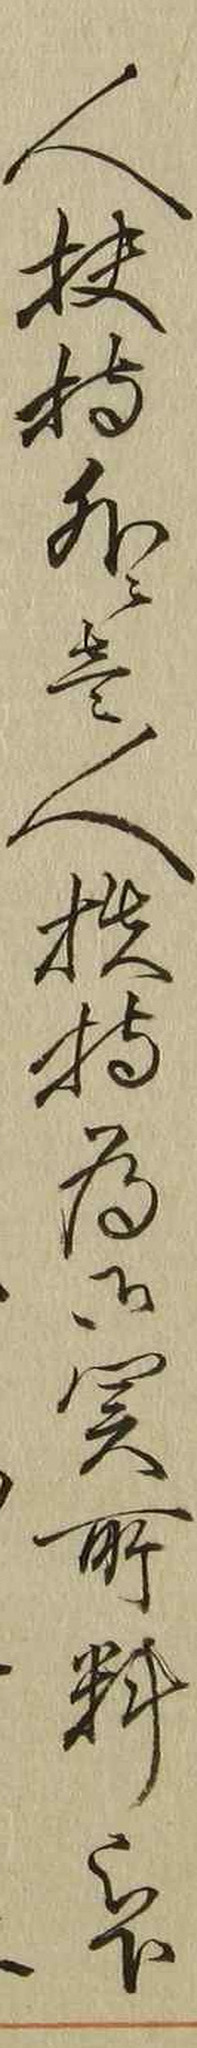人扶持外ニ壱人扶持為御関所料被下
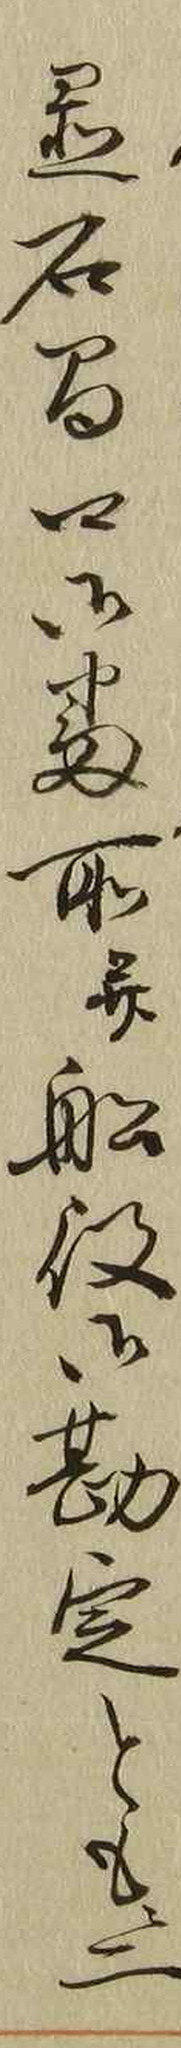置石間口御番所并船役御勘定ともニ二
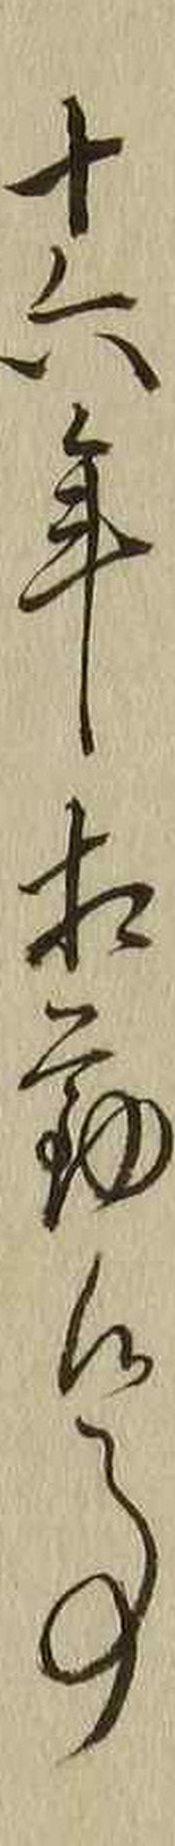十六年相勤候事
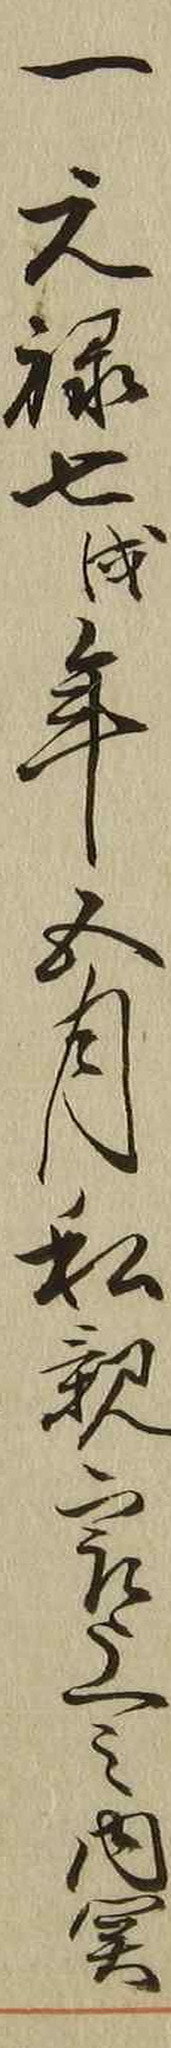一元禄七戌年五月私親最上之内関
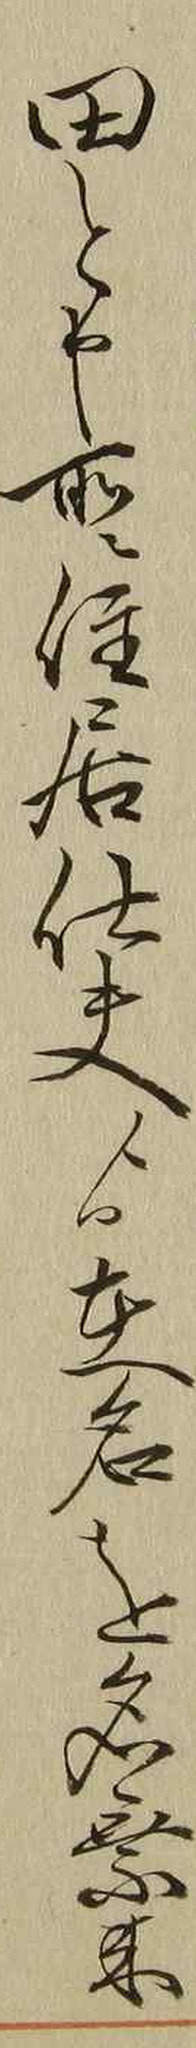田と申所ニ住ニ居仕夫ゟ在名を名乗来
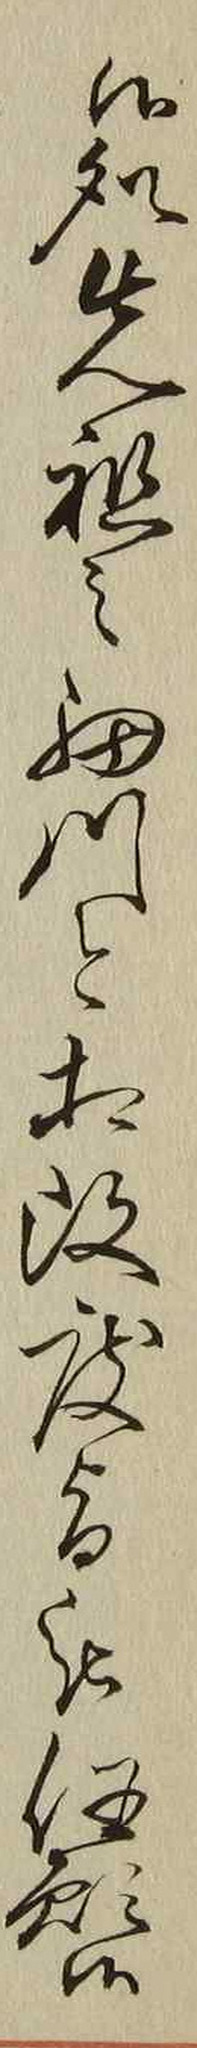候処先祖之細川と相改度旨被任願候
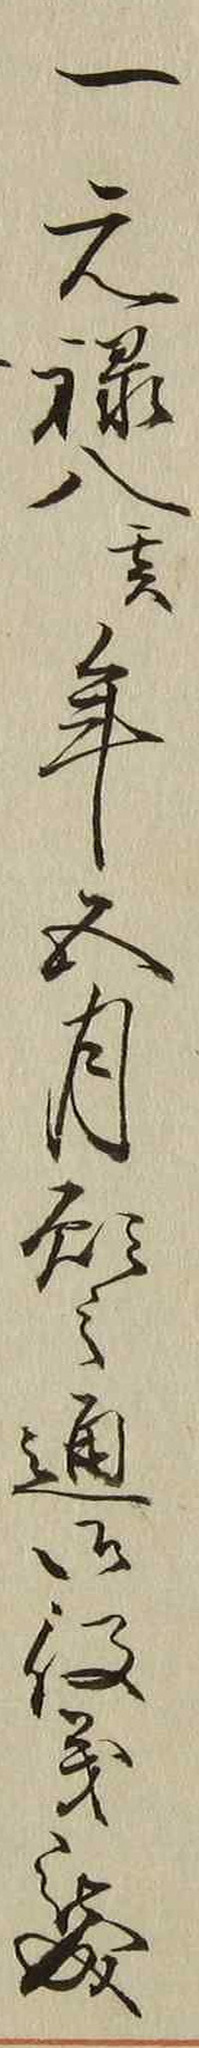一元禄八亥年五月願之通御役義被成
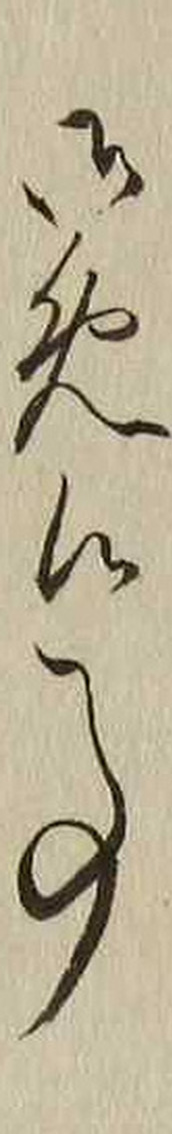御免候事
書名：諸士系譜　巻之57　ほ之部4
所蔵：会津若松市立会津図書館
